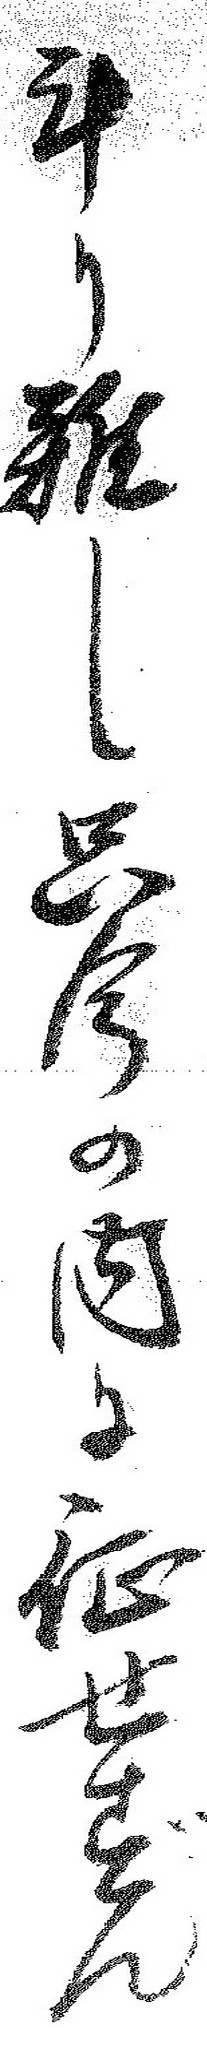斗り難し只今の内に征せずん
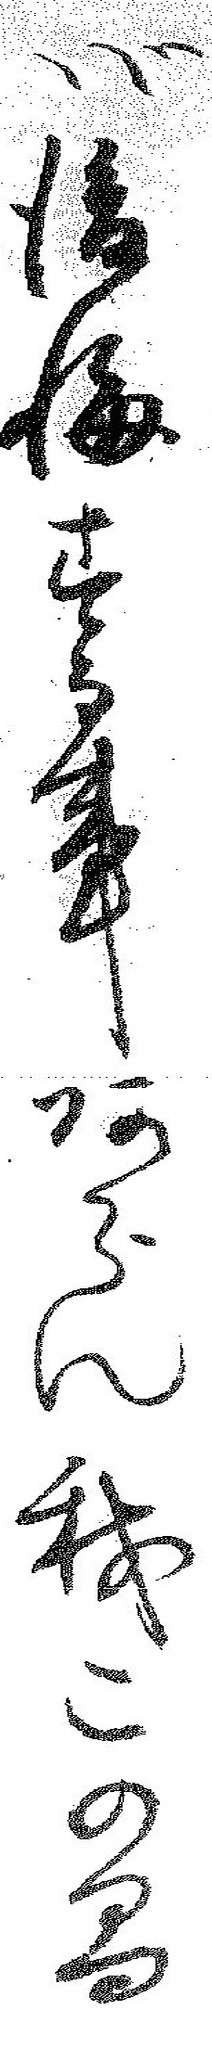ば後悔する事あらん我この間
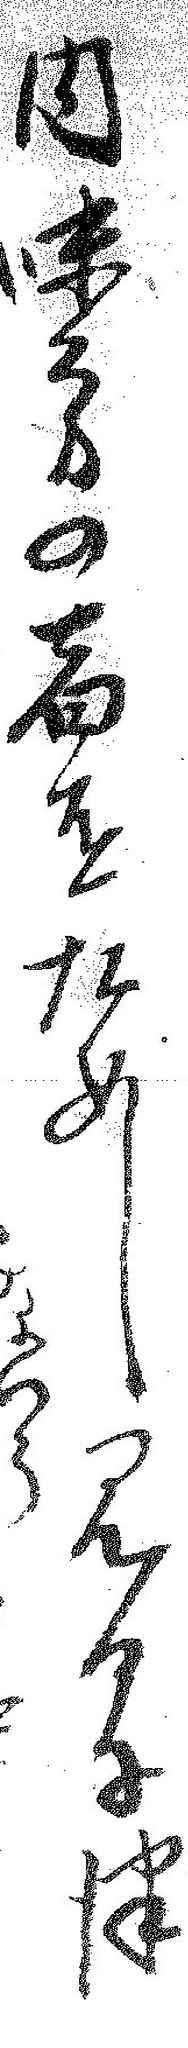内味方の者をためしみるに津
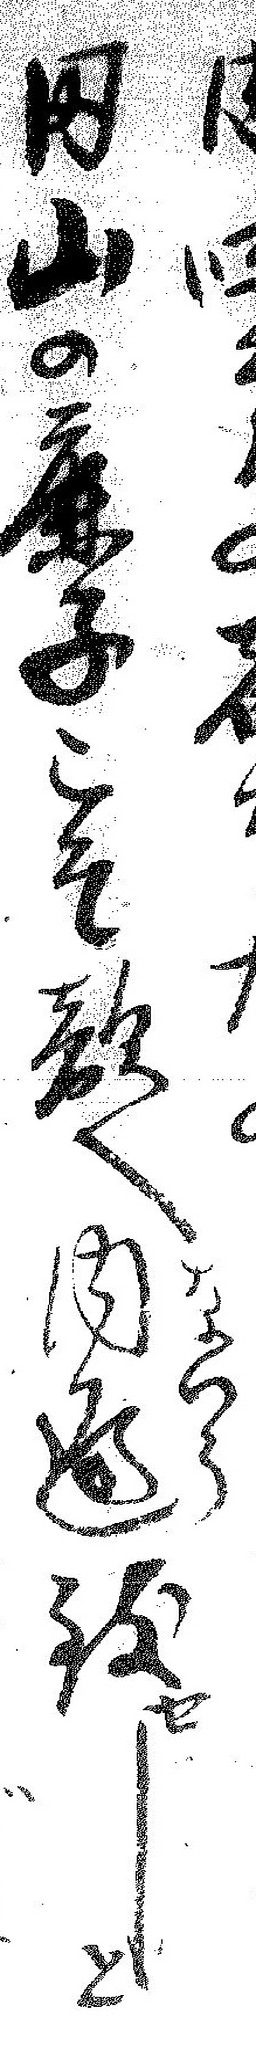田山の鹿子こそ敵へ内通致せしと
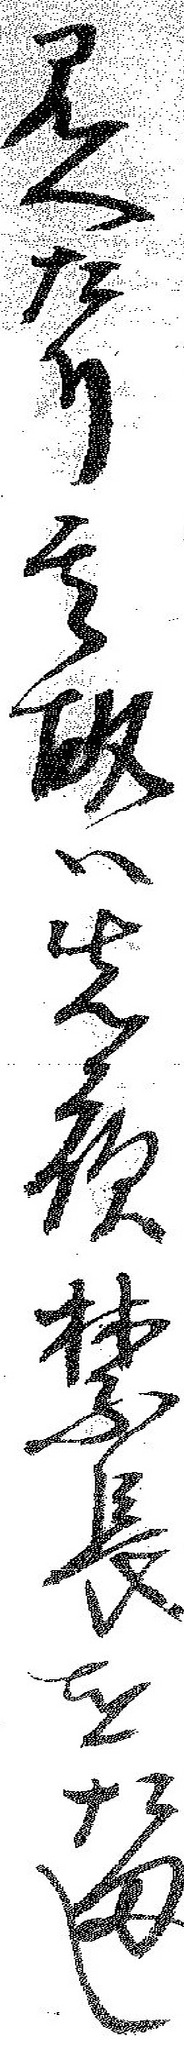見へたり其故は先夜禁長をだまし
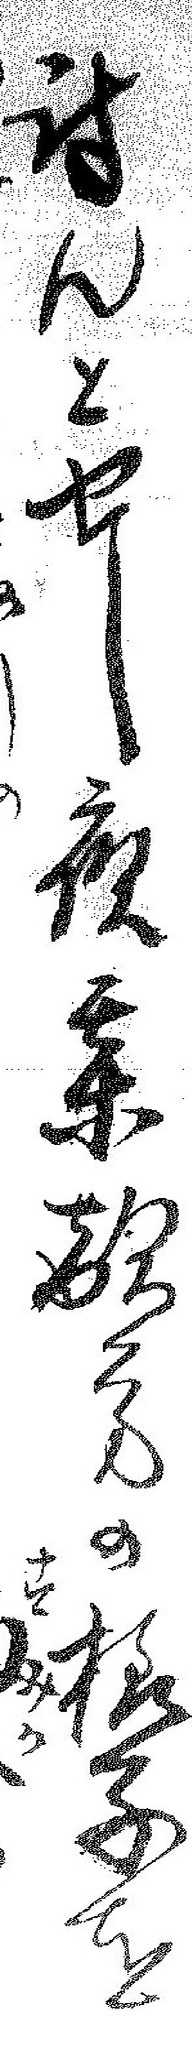討んとせし夜某敵方の様子を
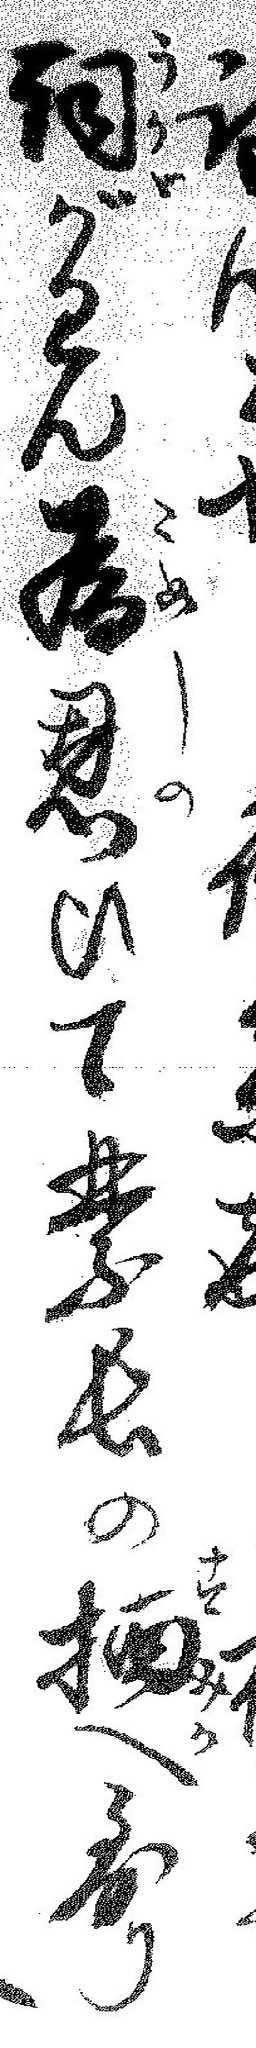伺がわん為忍ひて禁長の栖へ至り
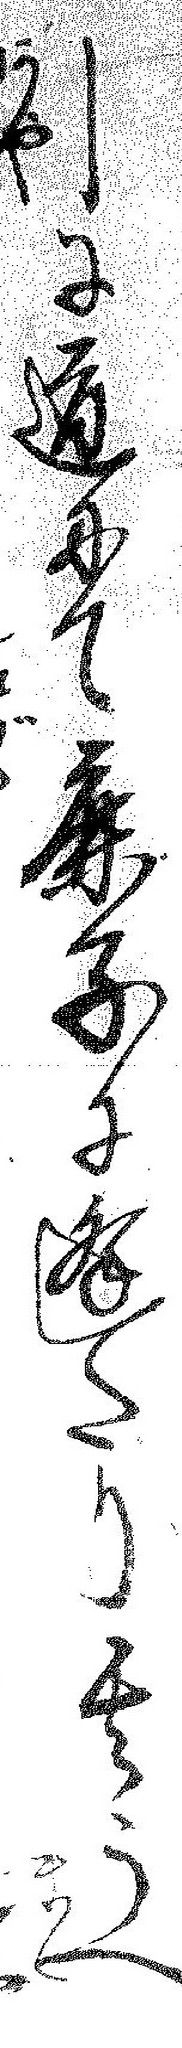しに道にて鹿子に逢たり其うへ
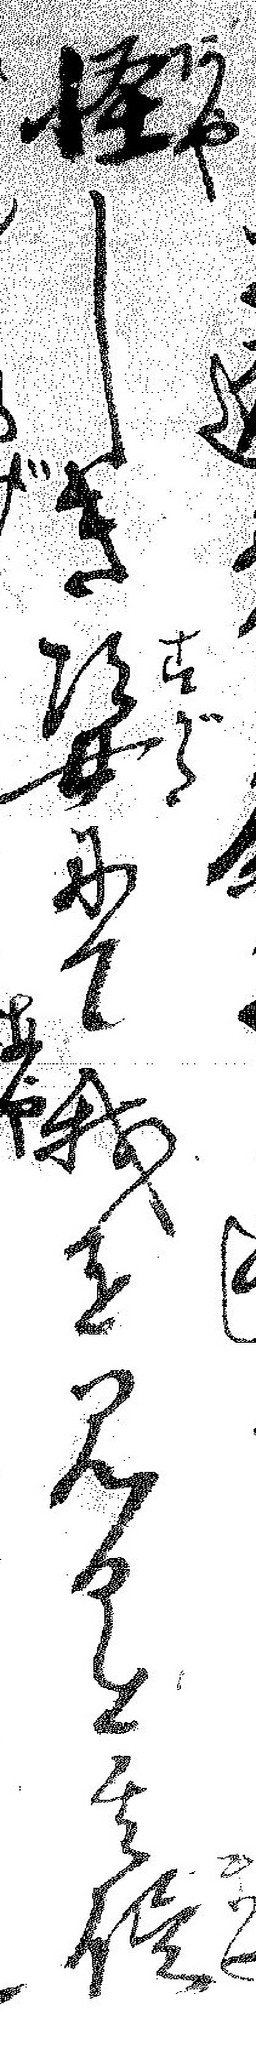怪しき姿にて我を見ると其侭
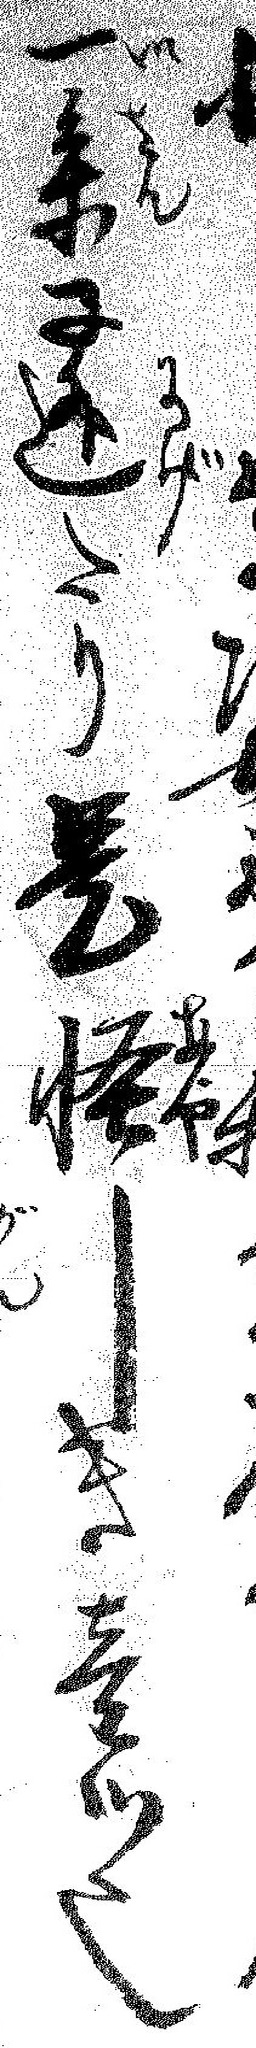一参に逃たり是怪しき壱ツ也
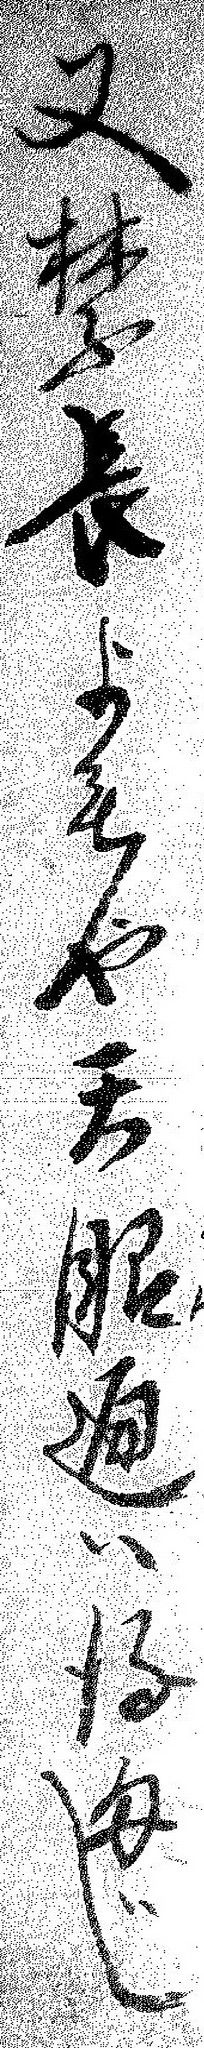又禁長よもや天眼通は得まじ

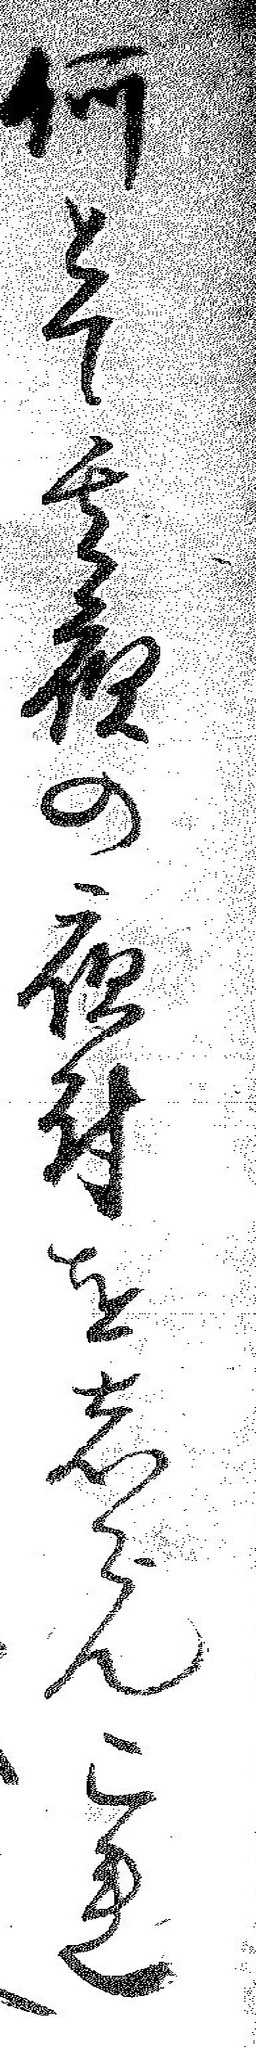何とて其夜の夜討をしらんこれ
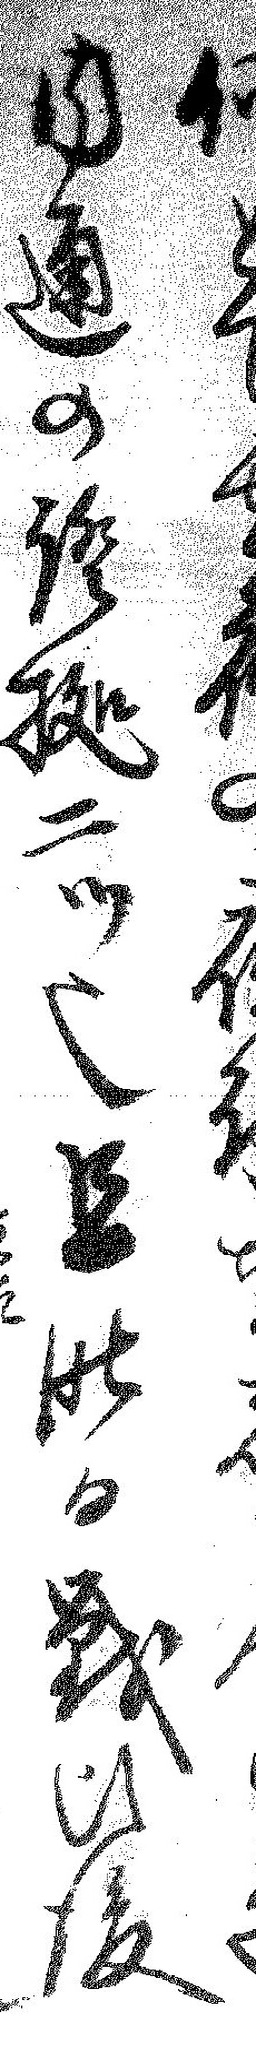内通の証拠二ツ也且昨日戦ひ後
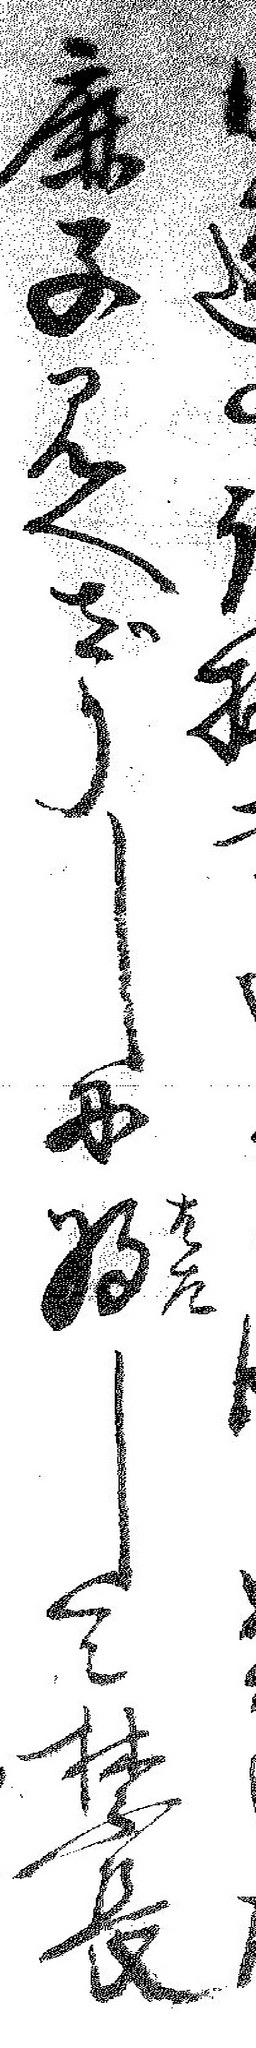鹿子見へざりしに将して禁長
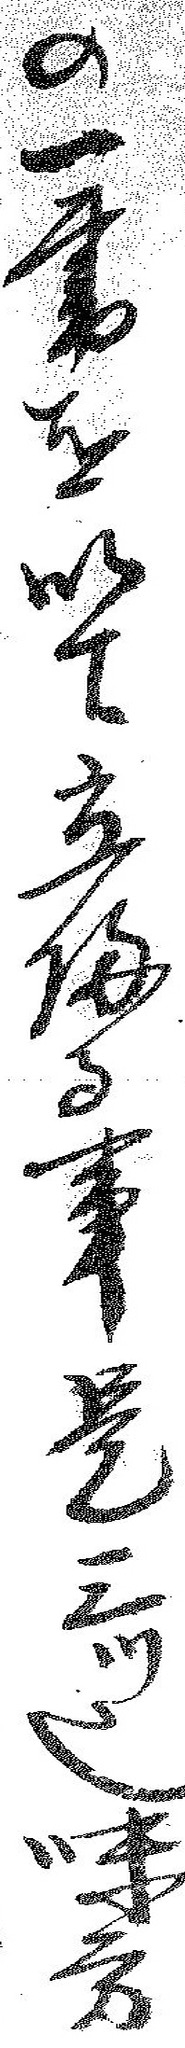の一書を以て立帰る事是三ツ也味方
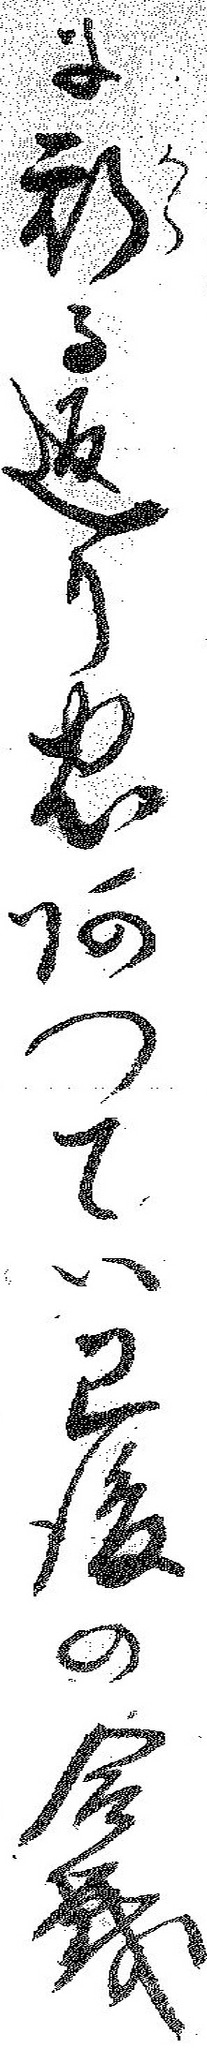に斯る返り忠あつては已後の合戦
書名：近頃古狸珍説　礼義智信
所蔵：徳島県立図書館
